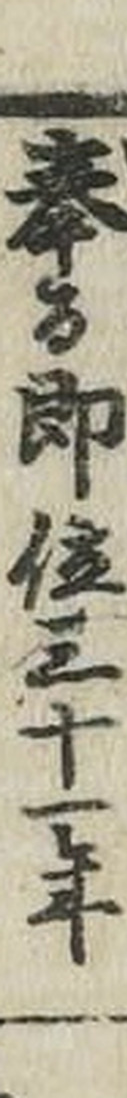奉る即位三十一年
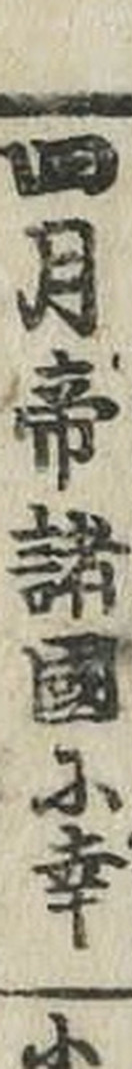四月帝諸国に幸
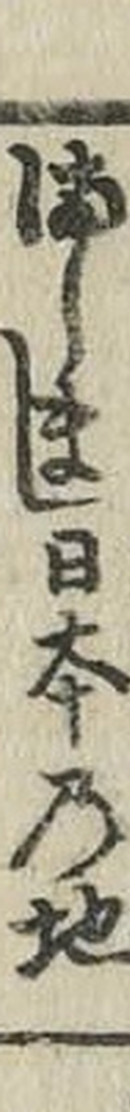ましまし日本の地
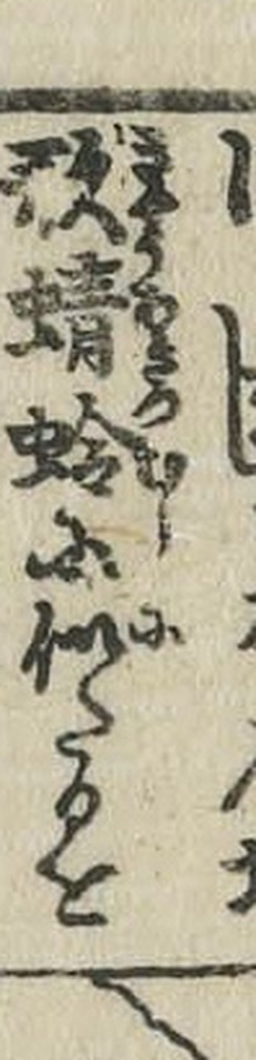形蜻蛉に似たるを
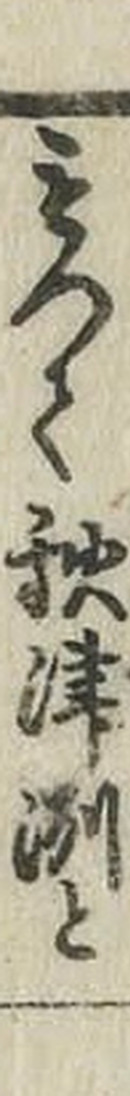もつて秋津州と
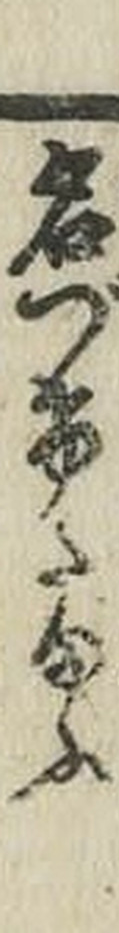名づけたまふ
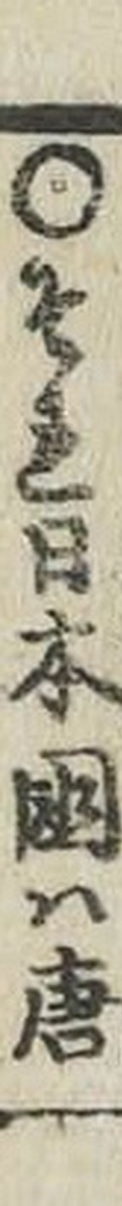○それ日本国は唐
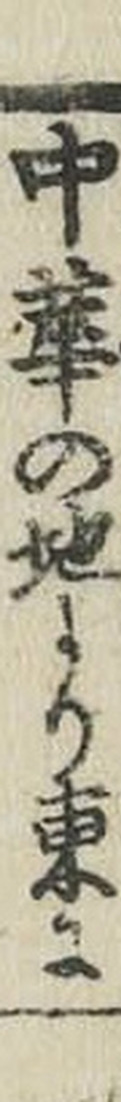中華の地より東に
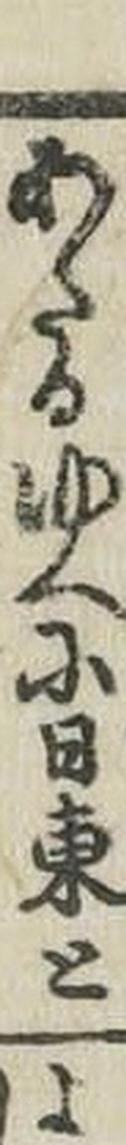あたるゆへに日東と
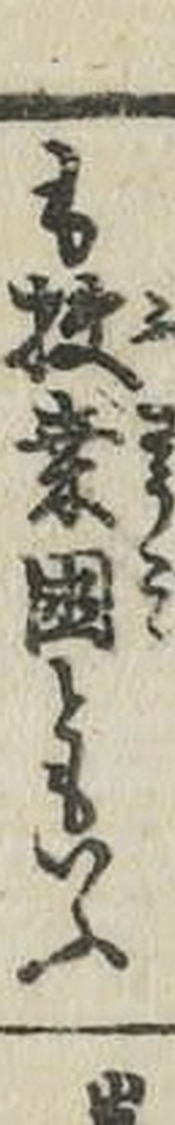も扶桑国ともいふ
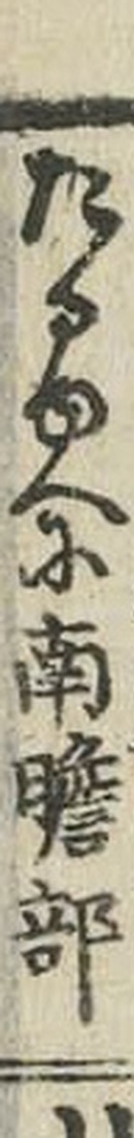たるゆへに南瞻部
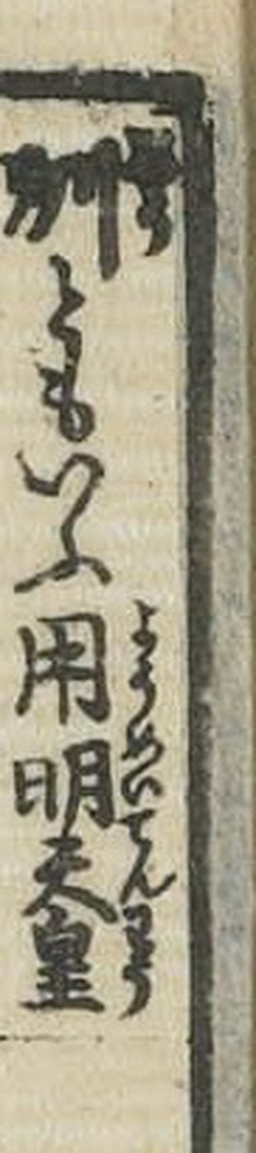州ともいふ用明天皇
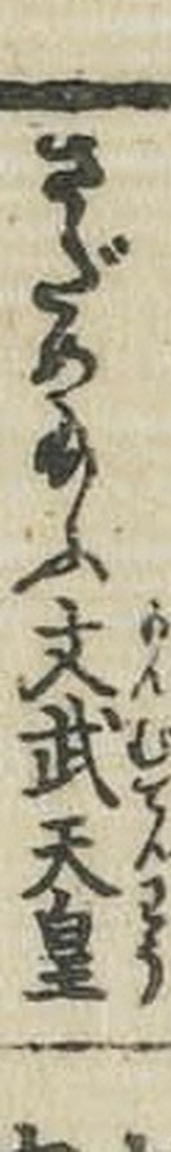さだめ給ふ文武天皇
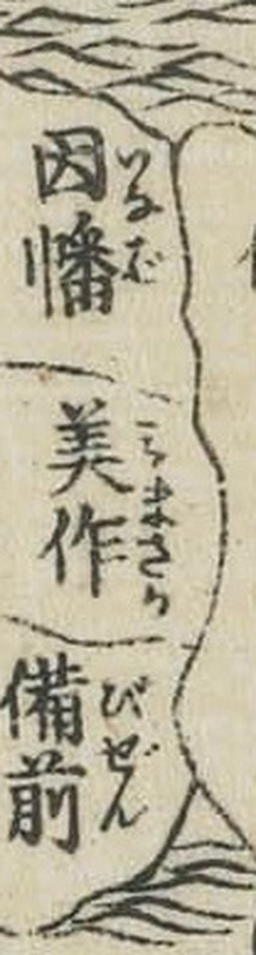因幡美作備前
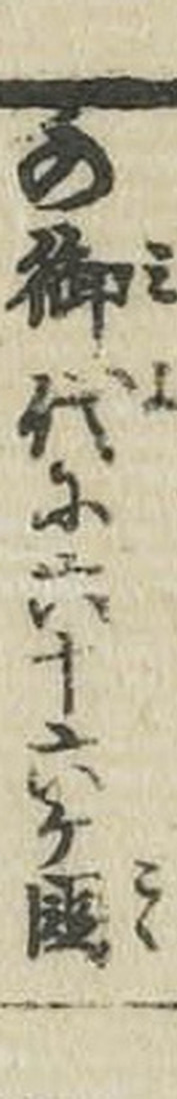の御代に六十六ヶ国
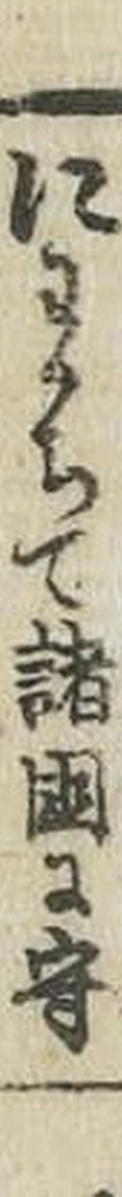にわかちて諸国に守
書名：増補頭書訓蒙図彙大成 10巻 2:巻之1-3
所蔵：東京学芸大学教育コンテンツアーカイブ
